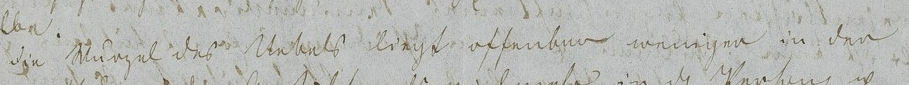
Die Wurzel des Uebels liegt offenbar weniger in der
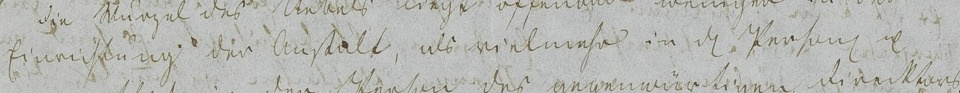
Einrichtung der Anstalt, als vielmehr in den Personen u
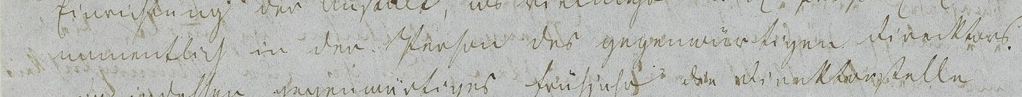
namentlich in der Person des gegenwärtigen Direcktors.
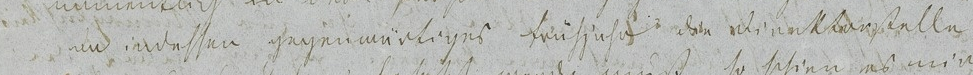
Da indessen gegenwärtiges Frühjahr die Direcktorstelle
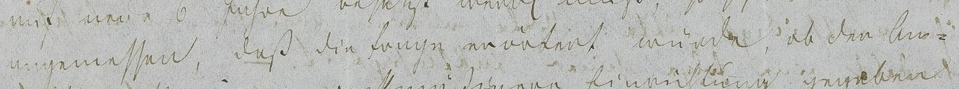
angemessen, daß die Frage erörtert würde, ob der An-
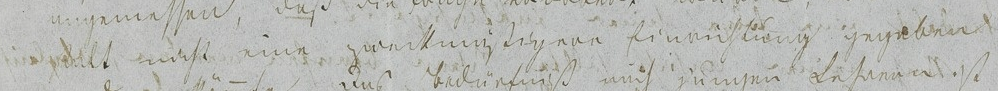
stalt nicht eine zweckmäßigere Einrichtung gegeben
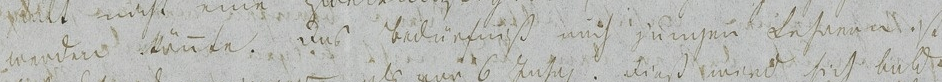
werden könnte. Das Bedürfniß nach jungen Lehrern ist
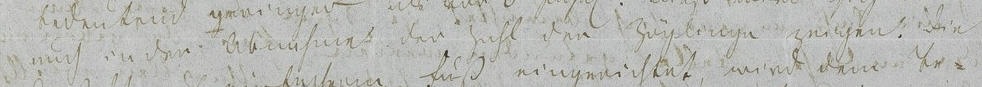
auch in der Abnahme der Zahl der Zöglinge zeigen. Die
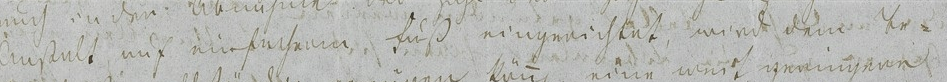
Anstalt auf einfacherm Fuß eingerichtet, wird dem Be-
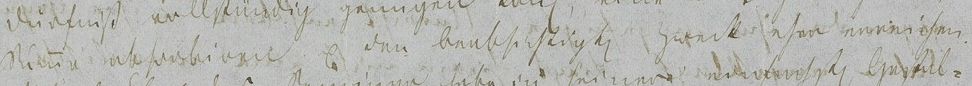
Summe absorbiren & den beabsichtigten Zweck eher erreichen.
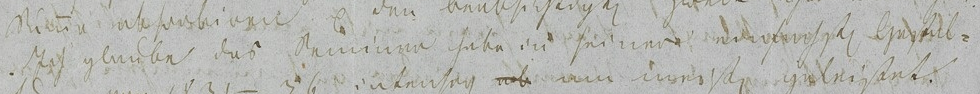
Ich glaube das Seminar habe in seiner einfachsten Gestal-
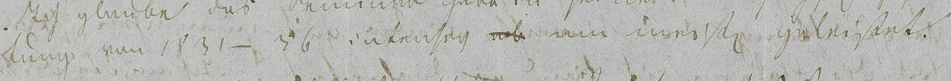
tung von 1831-36 intensiv ab am meisten geleistet.
